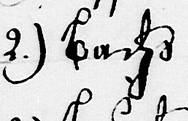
2.) Bachs
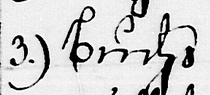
3.) Buchs
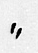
1.
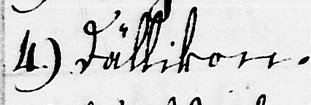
4.) Dällikon
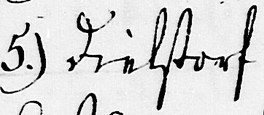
5.) Dielstorf
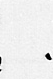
13.
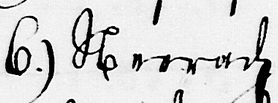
6.) Neerach
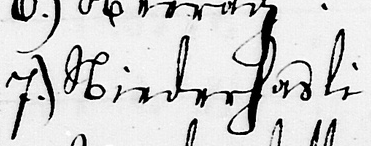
7.) Niederhasli
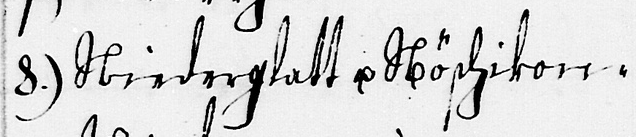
8.) Niederglatt u. Nöschikon
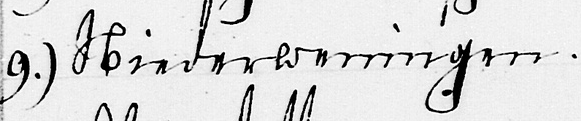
9.) Niederweningen
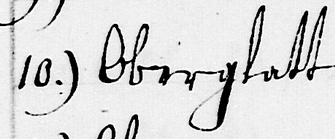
10.) Oberglatt
